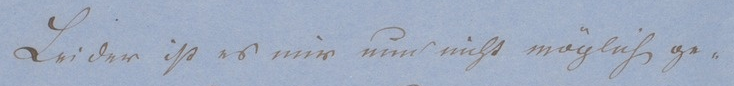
Leider ist es mir nun nicht möglich ge-
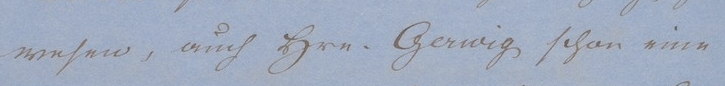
wesen, auch Hrn. Gerwig schon eine
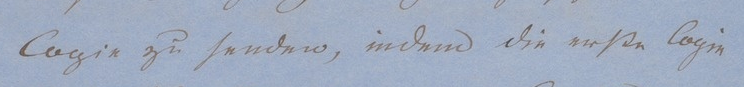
Copie zu senden, indem die erste Copie
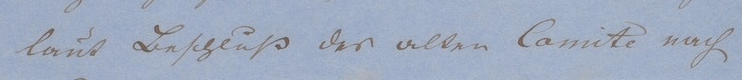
laut Beschluß des alten Comite nach
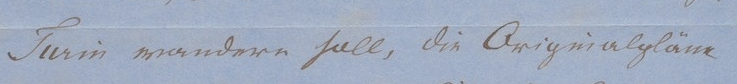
Turin wandern soll, die Originalpläne
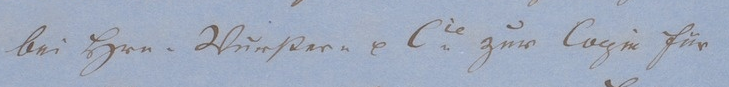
bei Hrn. Wurster. & Cie zur Copie für
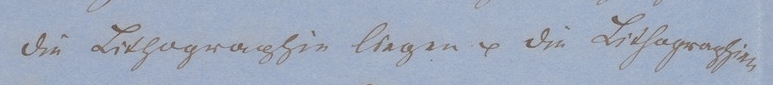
die Lithographie liegen & die Lithographien
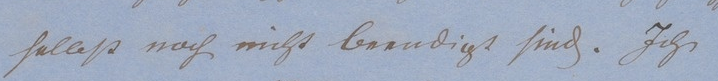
selbst noch nicht beendigt sind. Ich
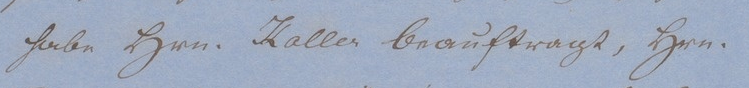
habe Hrn. Koller beauftragt, Hrn.
